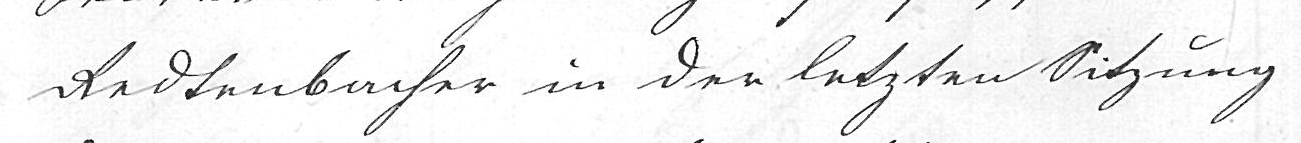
Redtenbacher in der letzten Sitzung
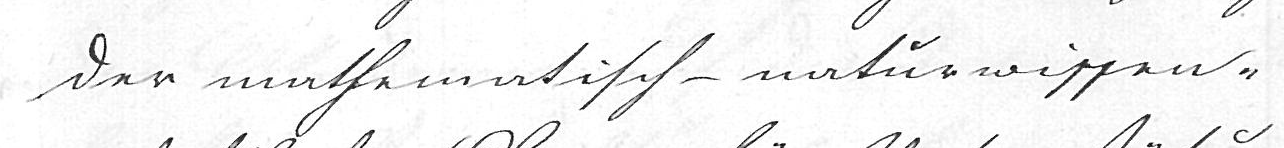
der mathematisch-naturwissen-
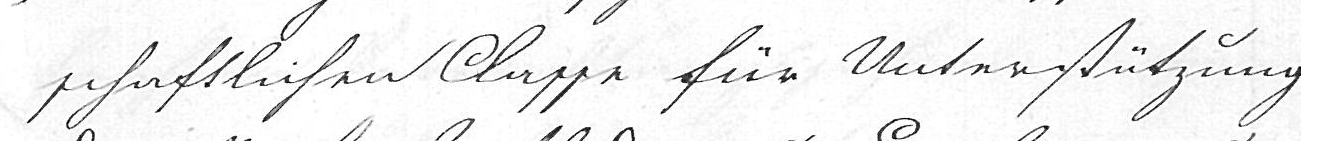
schaftlichen Classe für Unterstützung
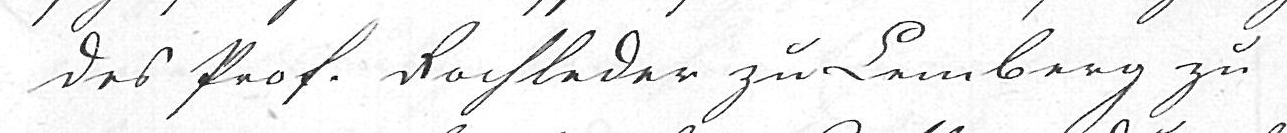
des Prof. Rochleder zu Lemberg zu
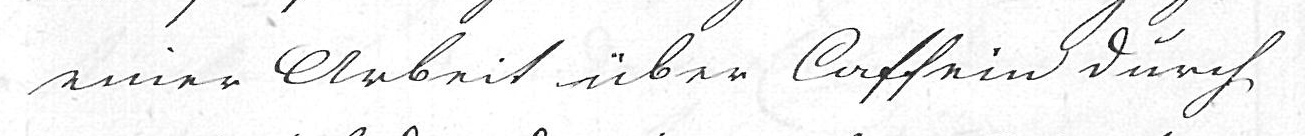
einer Arbeit über Caffein durch
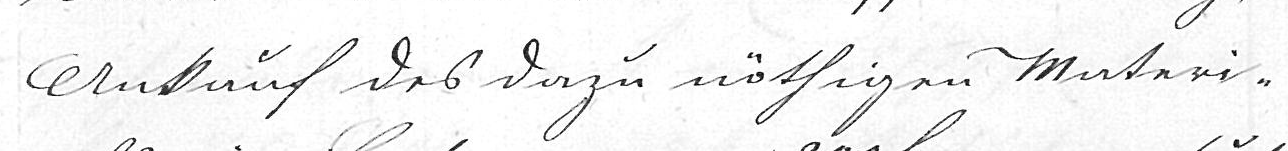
Ankauf des dazu nöthigen Materi-
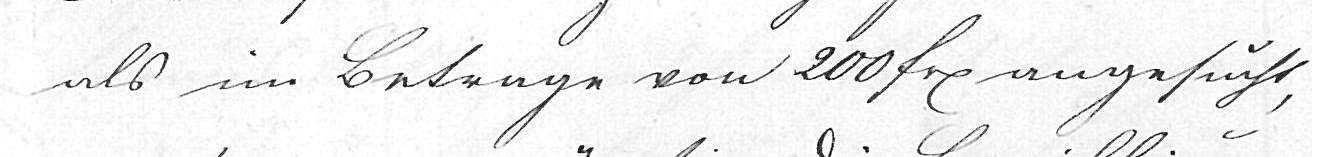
als im Betrage von 200 fr angesucht,
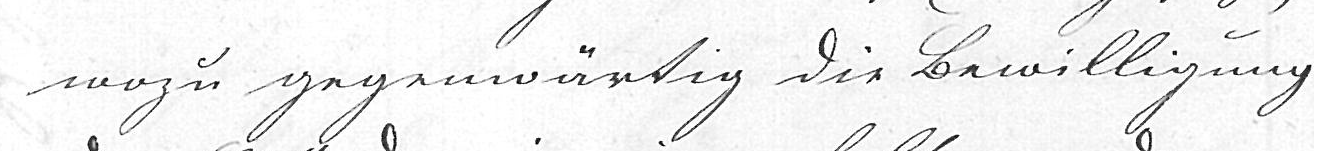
wozu gegenwärtig die Bewilligung
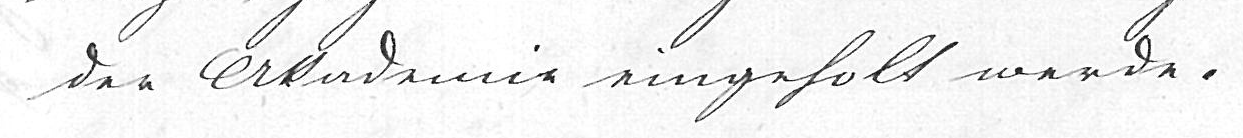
der Akademie eingeholt werde.
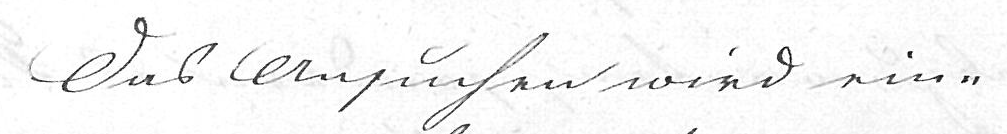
Das Ansuchen wird ein-
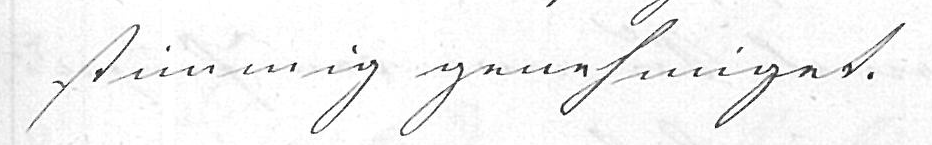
stimmig genehmiget.
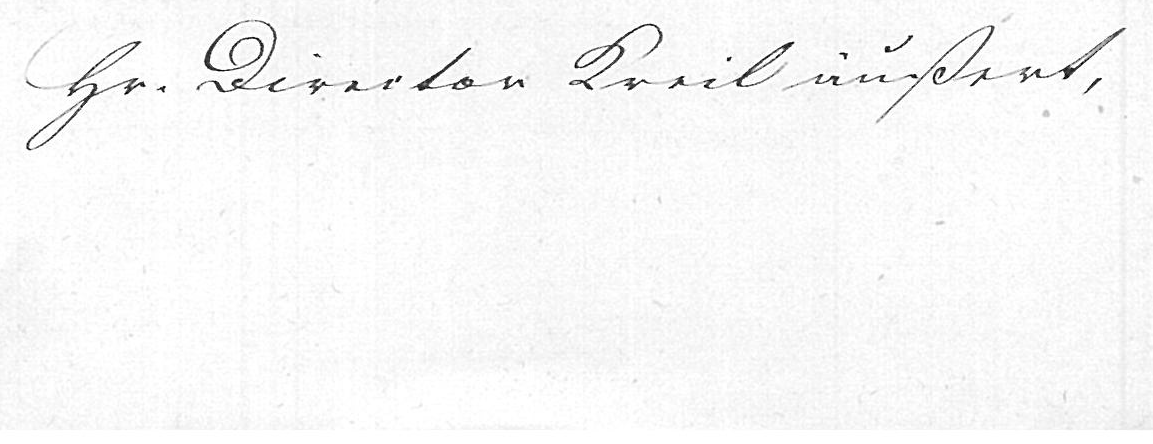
Hr. Director Kreil äußert,
